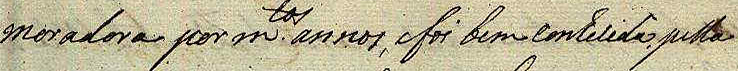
moradora por mtos. annos, e foi bem conhecida pella
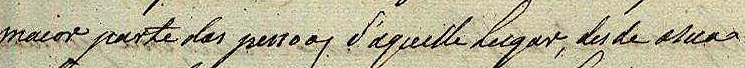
maior parte das pessoas d'aquelle Lugar, desde a sua
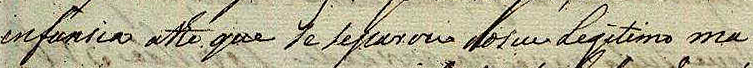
infansia athe que se separou do seu Legitimo ma
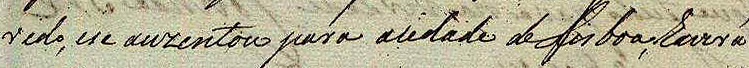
rido, e se auzentou para a cidade de Lisboa, haverá
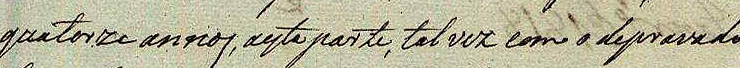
quatorze annos, a esta parte, talvez com o depravado
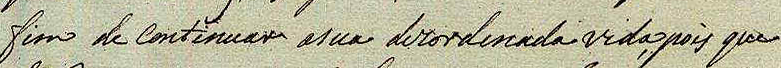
fim de continuar a sua dezordenada vida, pois que
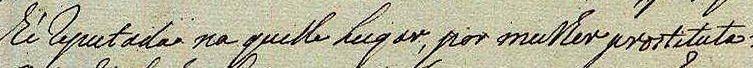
hé Reputada naquelle Lugar, por mulher prostituta.
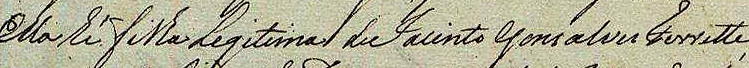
Ella hé filha Legitima de Iacinto Gonsalves Ferrette,
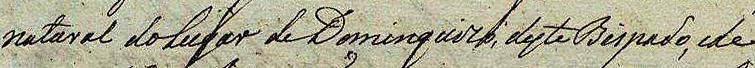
natural do Lugar de Dominguizo, deste Bispado, e de
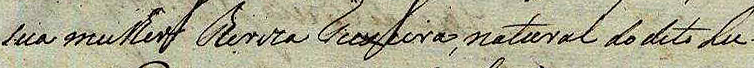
sua mulher Thereza Teixeira, natural do dito Lu
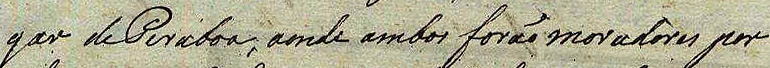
gar de Peraboa, aonde ambos foraõ moradores por
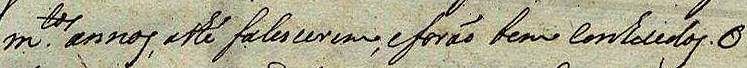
m.tos annos athe falescerem, e foraõ bem conhecidos. O
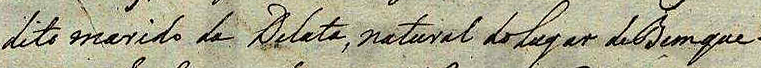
dito marido da Delata, natural do Lugar de Bemque
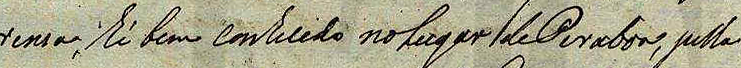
rensa, hé bem conhecido no Lugar de Peraboa, pella
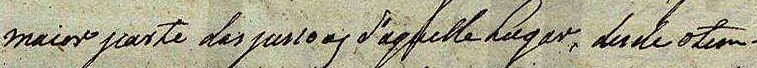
maior parte das pessoas d'aquelle Lugar, desde o tem
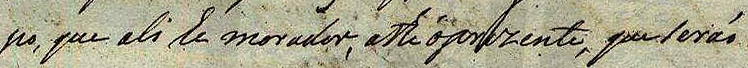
po, que ali he morador, athe o prezente, que seraõ
